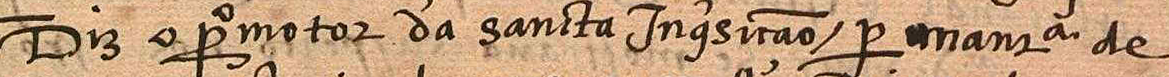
Diz o ꝓomotor da sancta Jnq̅sição/ ꝑ manra de
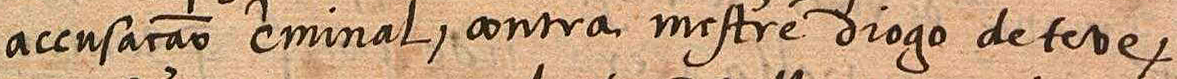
accusação c̅minaL, contra mestre diogo de teve,
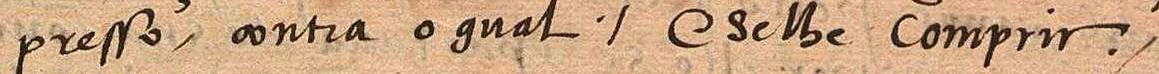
presso, contra o quaL./ e se lhe comprir./
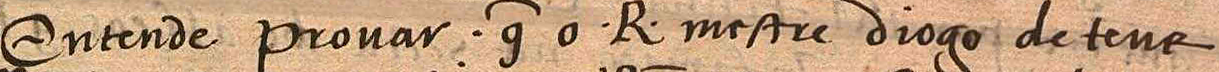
Entende prouar. q̅ o .R. mestre diogo de teue
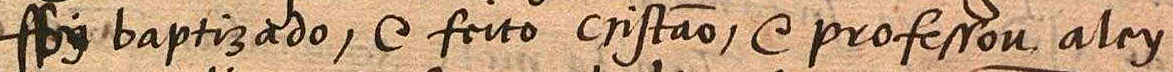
ffoy baptizado, e feito cristão, e professou a ley
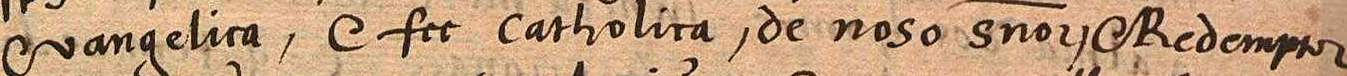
evangelica, e fee catholiça, de noso s̅nor, e Redemptor
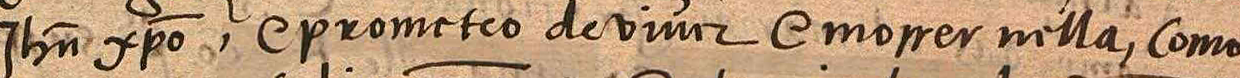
Jhu̅ xp̅o, e prometeo de viuer e morrer nella, como
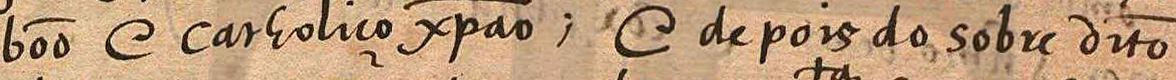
bo̅o e catholiço x̅pao; e depois do sobre di̅to
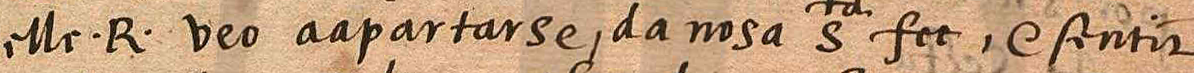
elle .R. veo a apartarse, da nosa Sta fee, e sentir
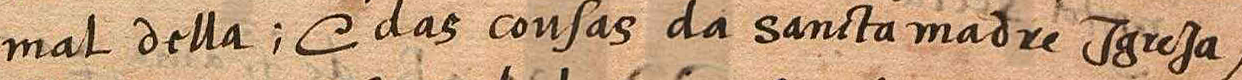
maL della; e das cousas da sancta madre Jgreja,
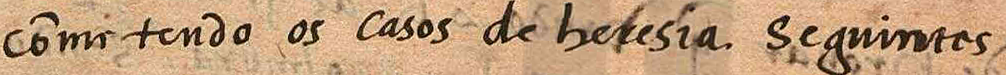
co̅metendo os casos de heresia seguintes.
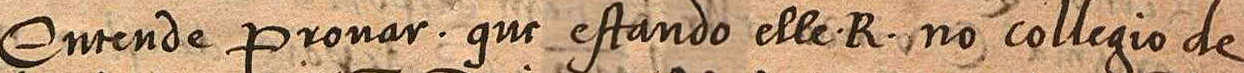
Entende prouar. que estando elle .R. no collegio de
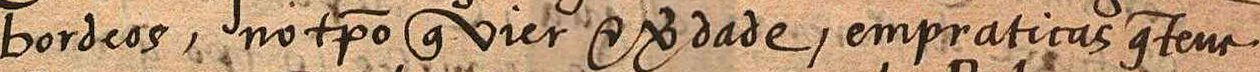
bordeos, no tp̅o q̅ vier e̅ ꝟdade, em praticas q̅ teue
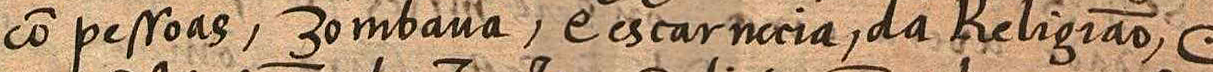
co̅ pessoas, zombaua, e escarnecia, da Religião, e
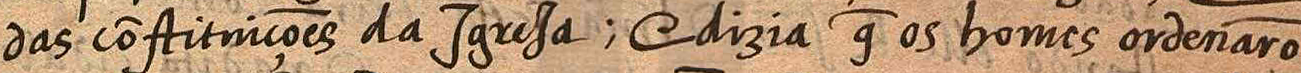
das co̅stituições da JgreJa; e dizia q̅ os homes orden̅aro
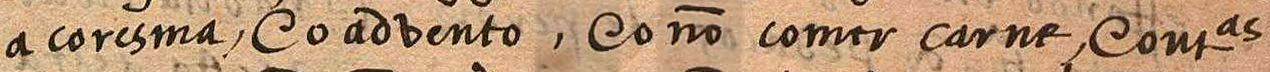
a coresma, e o advento, e o n̅o comer carne, e outas
